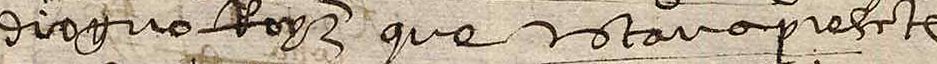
dioguo Royz̄ que estaua presēte
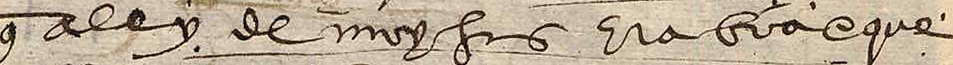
q̄ a ley de moyses Era bōa e que
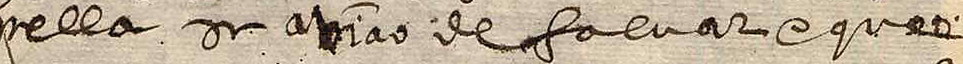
nella se avião de saluar e que o
